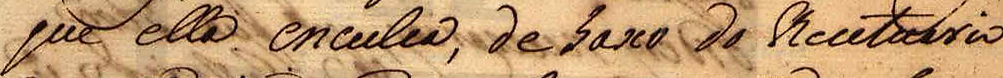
que ella enculca, debaxo do Recetuario
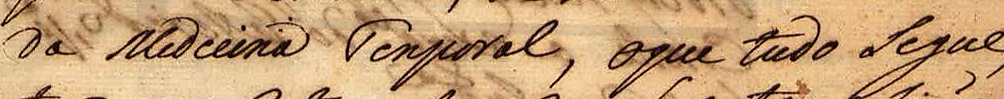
da Medecina Tenporal, o que tudo segue,
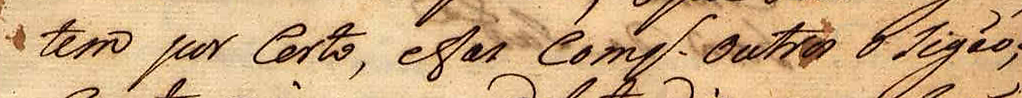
tem por certo, e fas com q̄. outros o sigaõ,
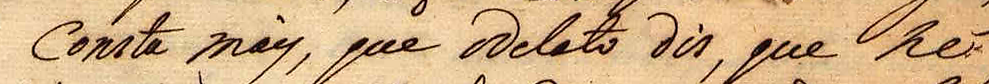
Consta mais, que o delato dis, que hé
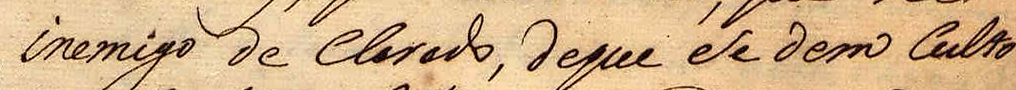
enemigo declarado, de que se dem Culto
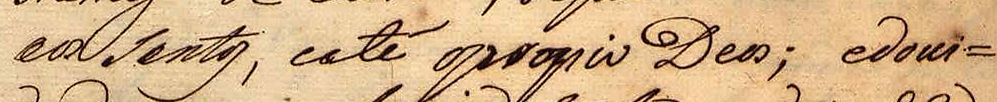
ao santos, e até o proprio Deos; e doui
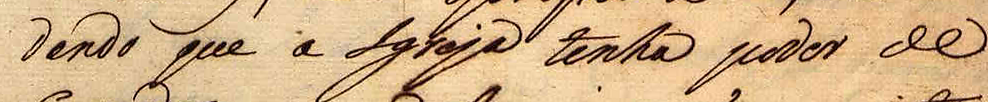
dando que a Igreja tenha poder de
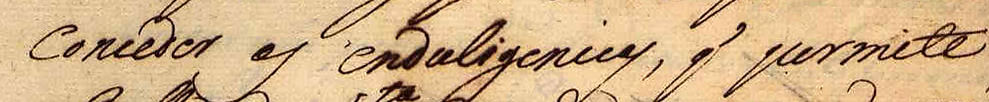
conceder as enduligencias, q̄ permite
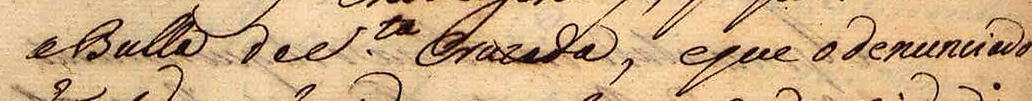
a Bulla de S.ta Cruzada, e que o denunciado
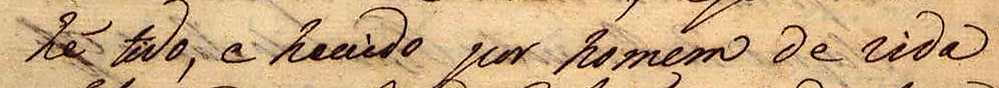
hé tido, e hauido por homem de vida
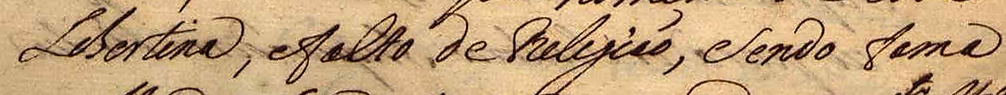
Lebertina, e falto de Religiaõ, sendo fama
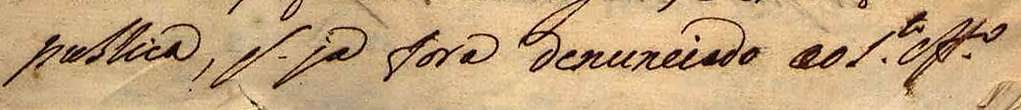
publica, q̄ ja fora denunciado ao s.o off.o
